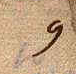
9
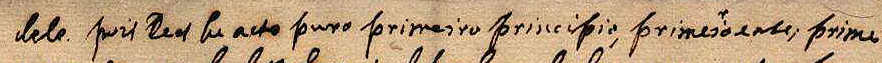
dele pois Deos he acto puro primeiro principio, primeiro ente; prime
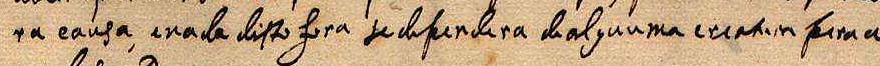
ra causa, e nada disto fora se dependera de alguma creatura pera a
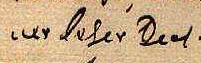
uer de ser Deos.
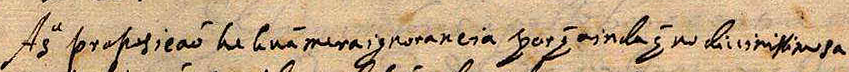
A 5a proposiçaõ he huā mera ignorancia porq̄ ainda q̄ no diuinissimo sa
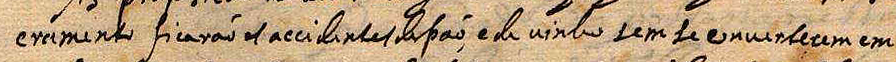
cramento ficaraõ os accidentes de paõ, e de uinho sem se conuerterem em
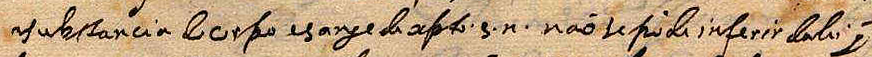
a substancia do corpo e sange de xpto. s. n. naõ se pode inferir dahi q̄
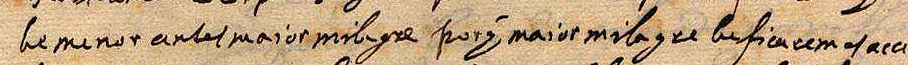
he menor antes maior milagre porq̄ maior milagre he ficarem os acci
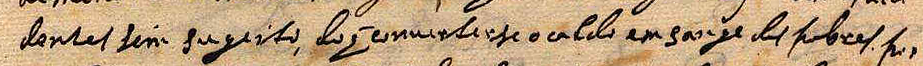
dentes sem sugeito, do q̄ conuerterse o caldo em sange dos pobres por
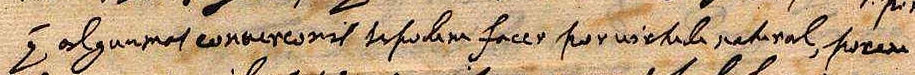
q̄ algumas conuerçonis se podem facer por uirtude natural, porem
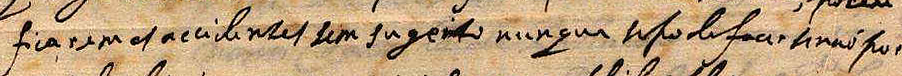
ficarem os accidentes sem sugeito nunqua se pode facer senaõ por
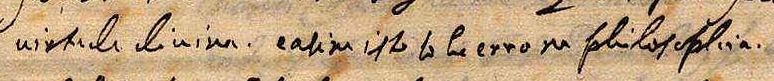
uirtude diuina. e asim isto so he erro na philosophia.
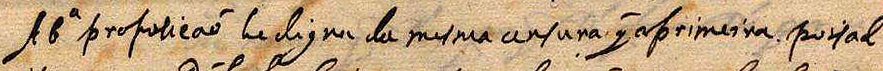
A 6a proposiçaõ he digna da mesma censura q̄ a primeira pois ad
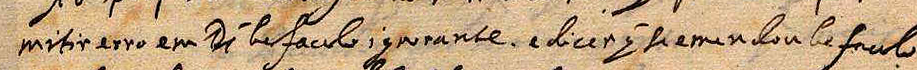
mitir erro em Ds̄ he facelo ignorante e dicer q̄ se emendou he facelo
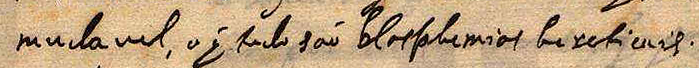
mudauel, o q̄ tudo saõ blasphemias hereticais.
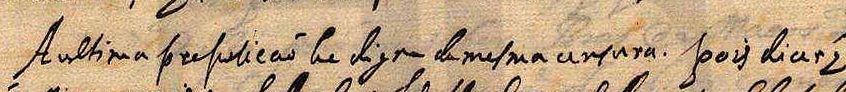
A ultima preposiçaõ he digna da mesma censura. pois dicer q̄
